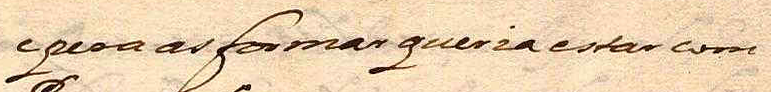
e pera as formar queria estar com
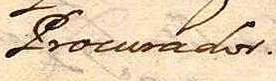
Procurador.
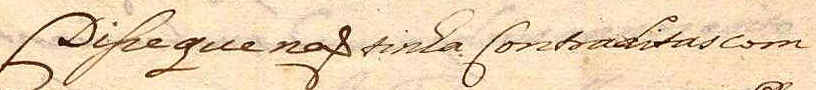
Disse que naõ tinha Contraditas com
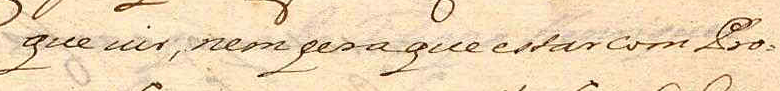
que uir, nem pera que estar com Pro
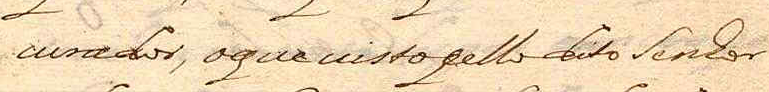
curador, o que uisto pello dito Senhor
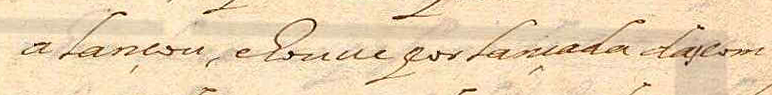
a Lançou, e houue por lançada das com
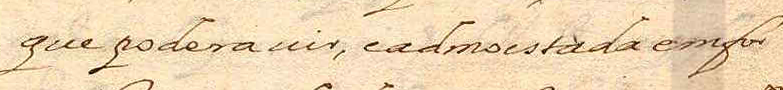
que podera uir, e admoestada em for
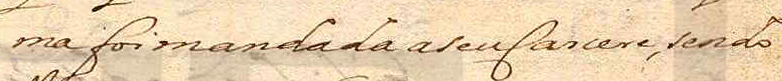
ma foi mandada a seu Carcere, sendo
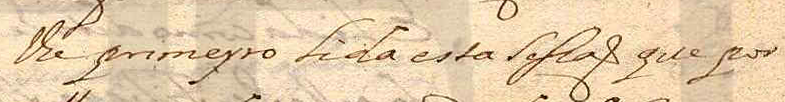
lhe primeyro Lida esta sessaõ que por
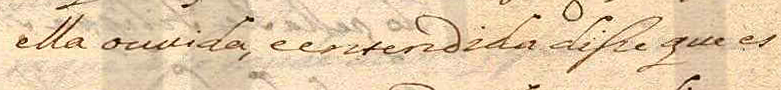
ella ouuida, e entendida disse que es
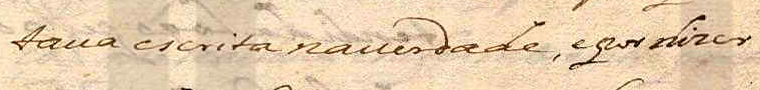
taua escrita na uerdade, e por dizer
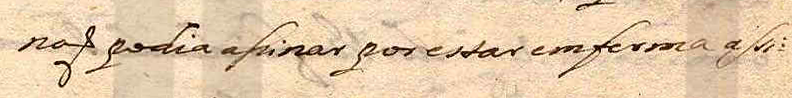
naõ podia assinar por estar emferma assi
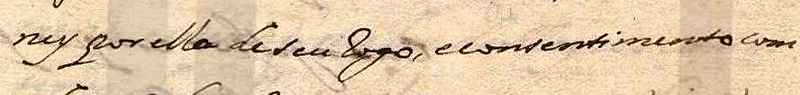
ney por ella de seu Rogo, e consentimento com
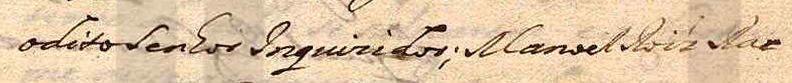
o dito Senhor Inquizidor, Manoel Roiz̄ Ra
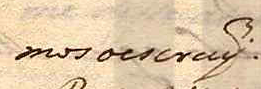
mos o escreuj.
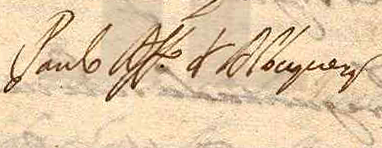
Paulo Aff.o d̄ Albuquerq̄
